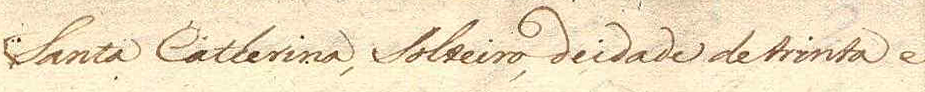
Santa Catherina, Solteiro, de idade de trinta e
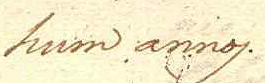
hum annos.
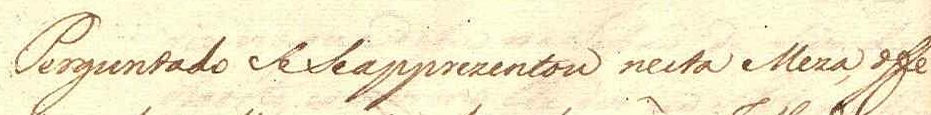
Perguntado se se apprezentou nesta Meza, offe
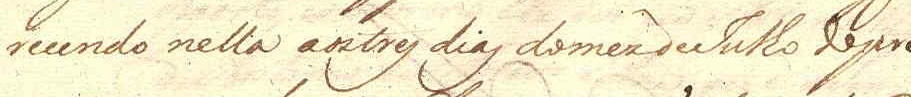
recendo nella aos tres dias do mez de Iulho do pre
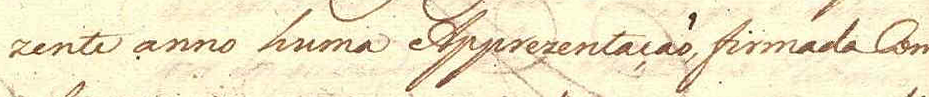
zente anno huma Apprezentaçaõ, firmada Com
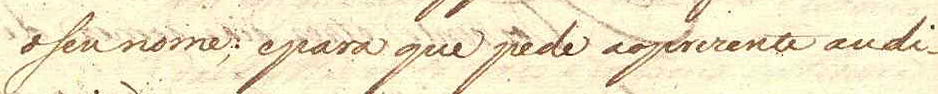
o seu nome; e para que pede ao prezente audi
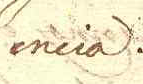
encia.
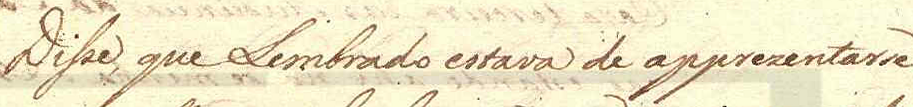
Disse, que Lembrado estava de apprezentarse
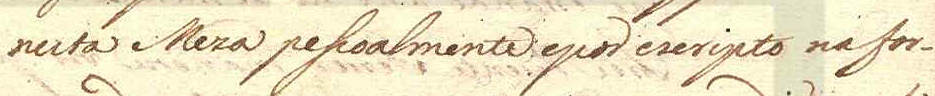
nesta Meza pessoalmente e por escripto na for
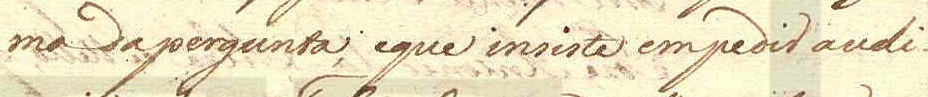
ma da pergunta; e que insiste em pedir audi
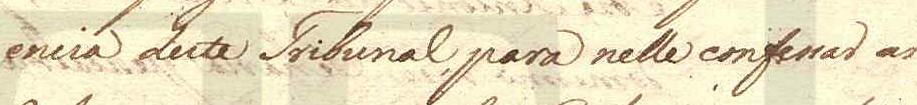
encia deste Tribunal, para nelle confessar as
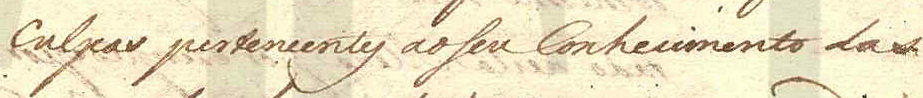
culpas pertencentes ao seu Conhecimento das
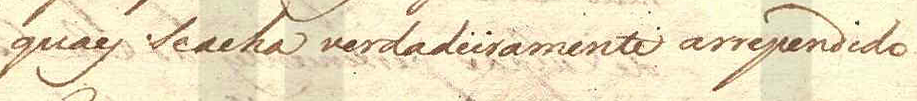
quaes se acha verdadeiramente arrependido
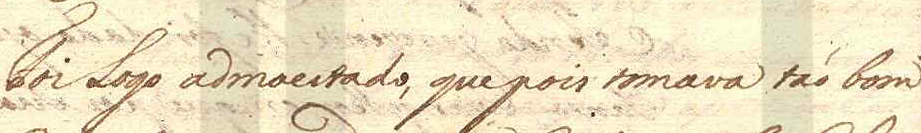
Foi Logo admoestado, que pois tomava taõ bom
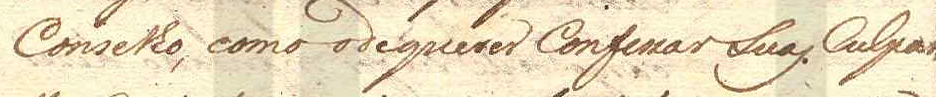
Conselho, como o de querer Confessar Suas Culpas
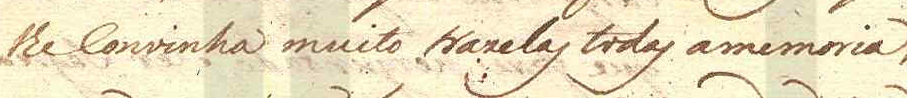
lhe Convinha muito trazelas todas a memoria,
